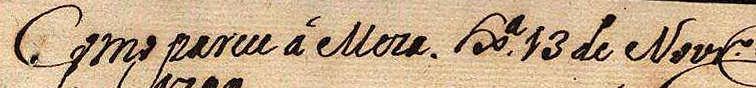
Como parece á Meza. Lx.a 13 de Novr.o
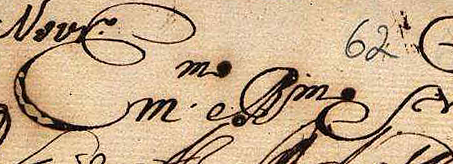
Em.mo e R.mo S.r
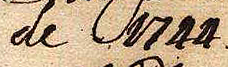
de 1744.
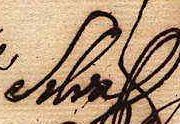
Silva
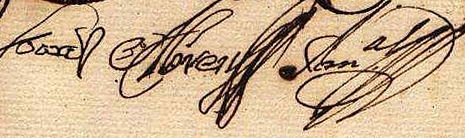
Joaõ Abreu Am.al
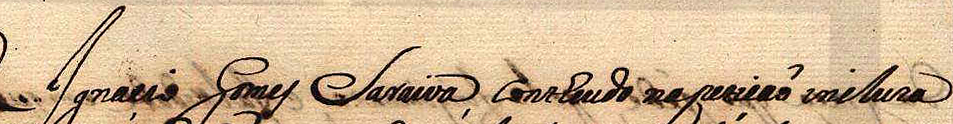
Jgnacio Gomes Saraiva, contheudo na petiçaõ incluza
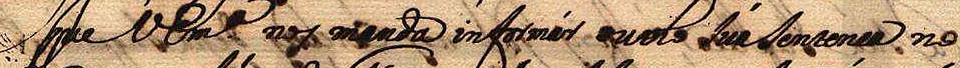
que V Em.a nos manda informar ouvio sua sentença no
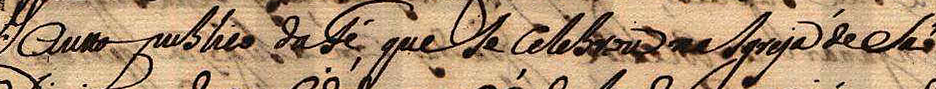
Autto publico da Fé, que se celebrou na Igreja de Saõ
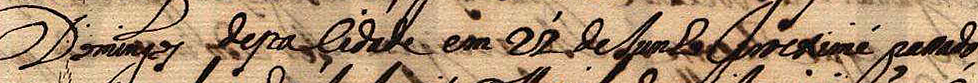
Domingos desta Cidade em 22 de Iunho proxime passado,
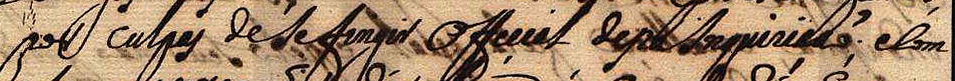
por culpas de se fingir Offecial desta Inquiziçaõ; e Com
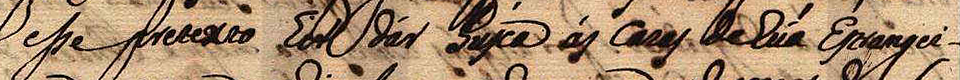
esse pretexto hir dár busca ás cazas de huā Estrangei
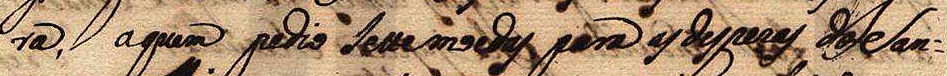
ra, a quem pedio sette moedas para as despezas dos San
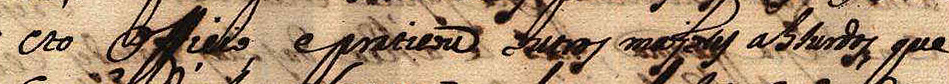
cto Officio, e praticou outros majores absurdos, que
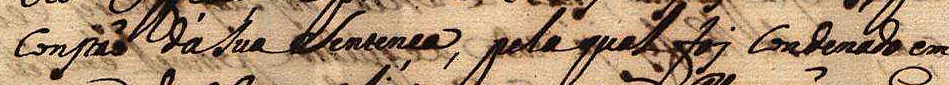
constão da sua Sentença, pela qual foj condenado em
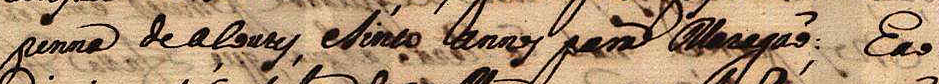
penna de açoutes, e sinco annos para Mazagaõ: E ao
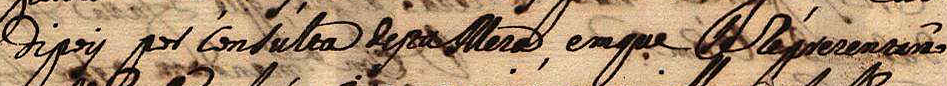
dipois por consulta desta Meza, em que se Reprezentarão
